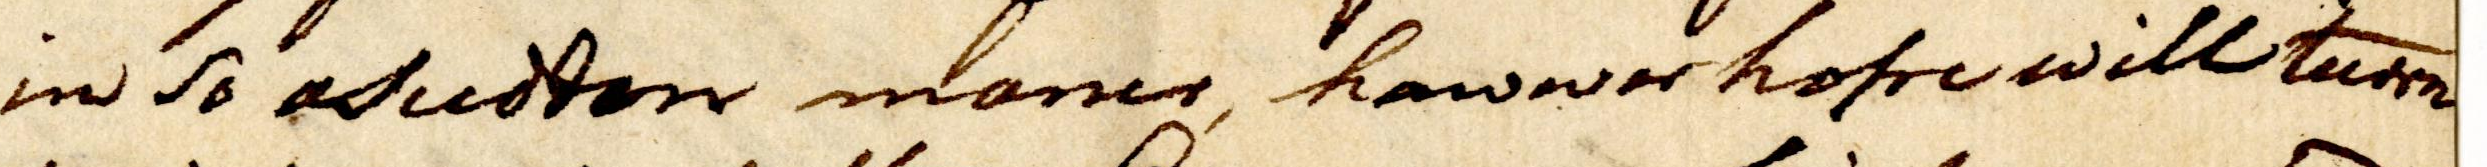in so a sudden maner, however hope will turn
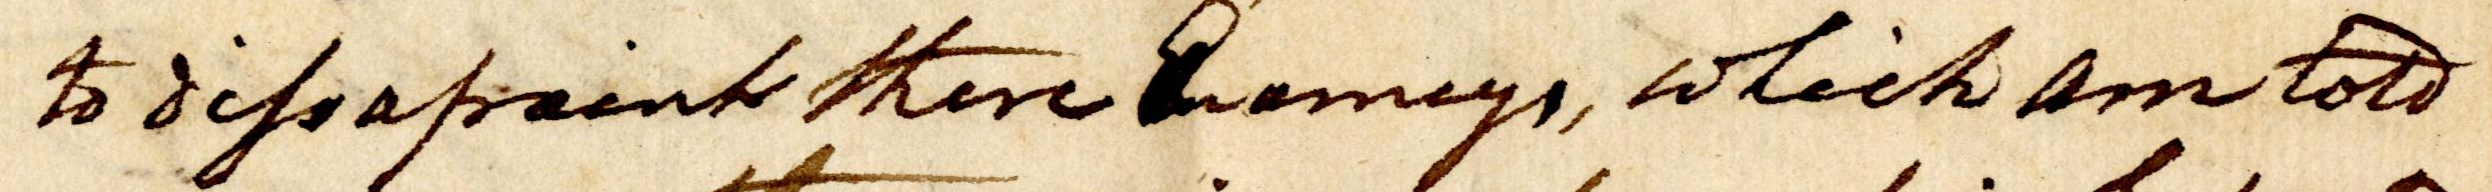to dissapoint there Attorneys, which am told
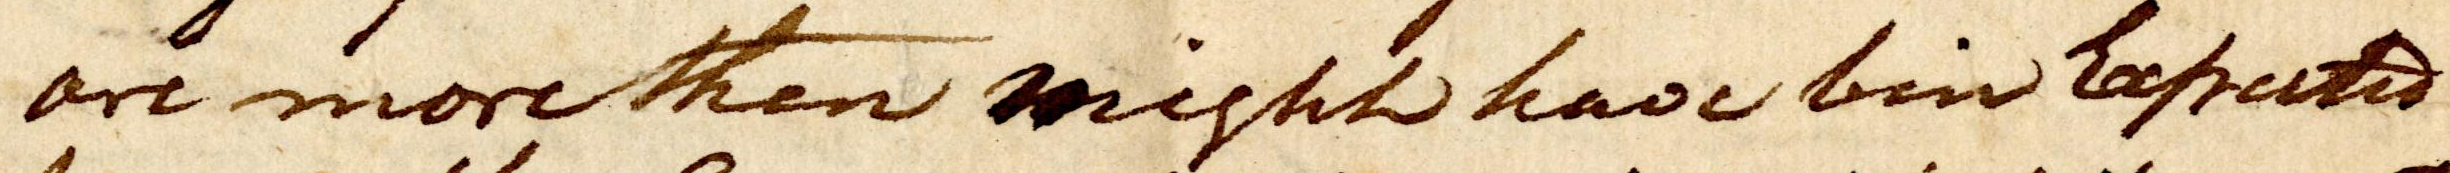are more then might have bin Expected
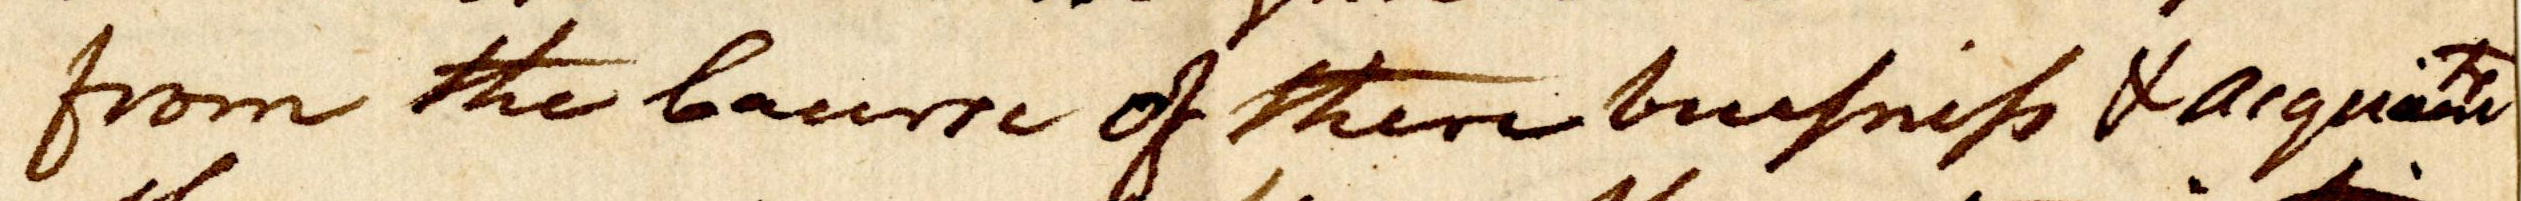from the Course of there business & acquain^t
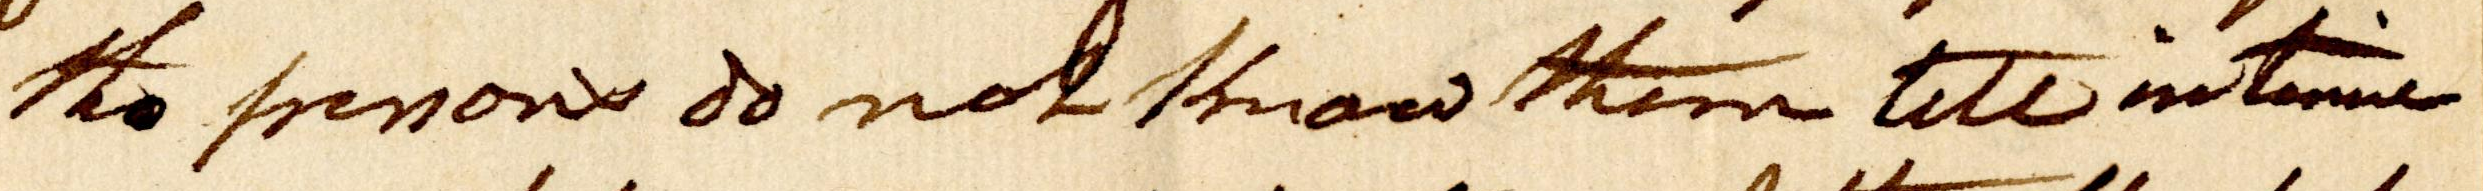the persons do not know them tell in time
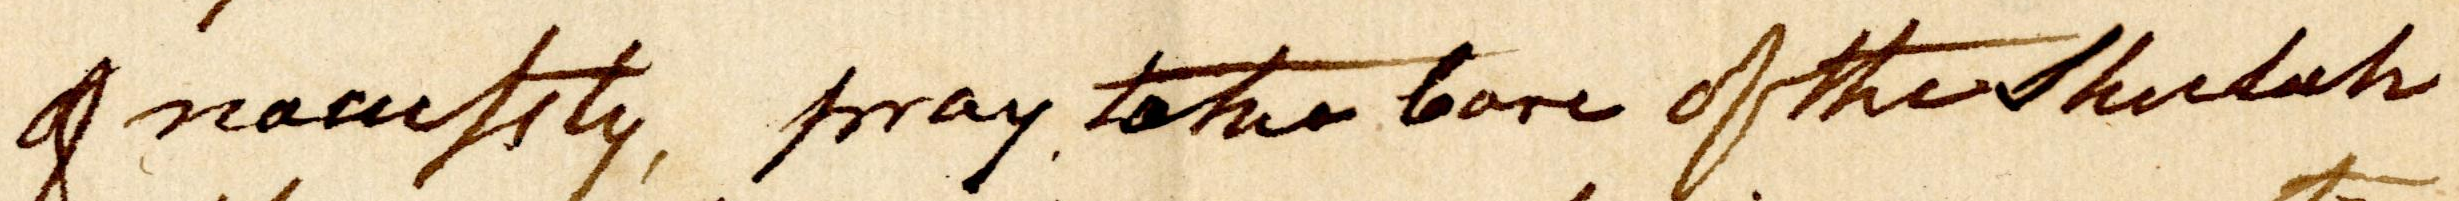of necessity pray take care of the shudah
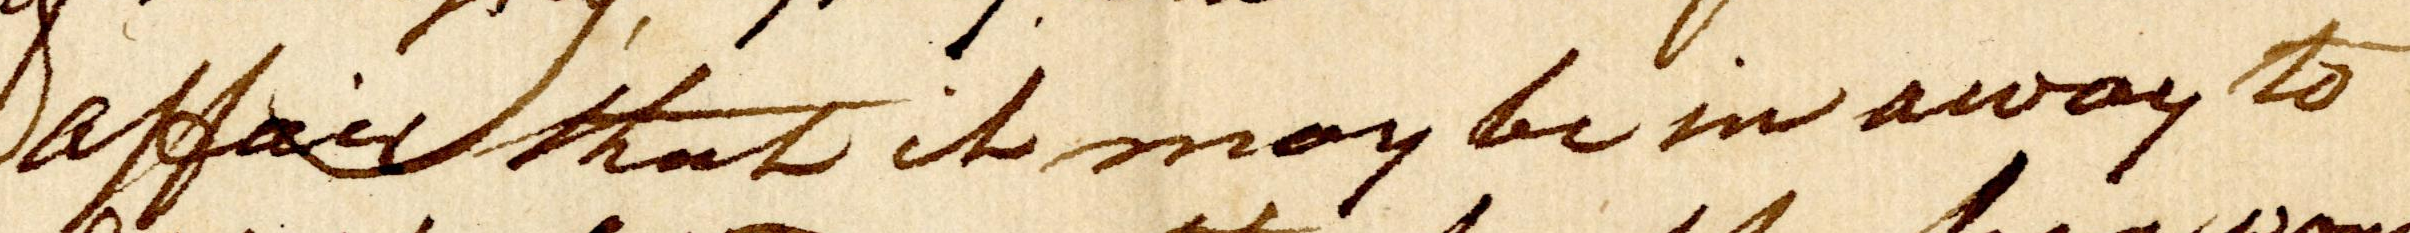affair that it may be in away to
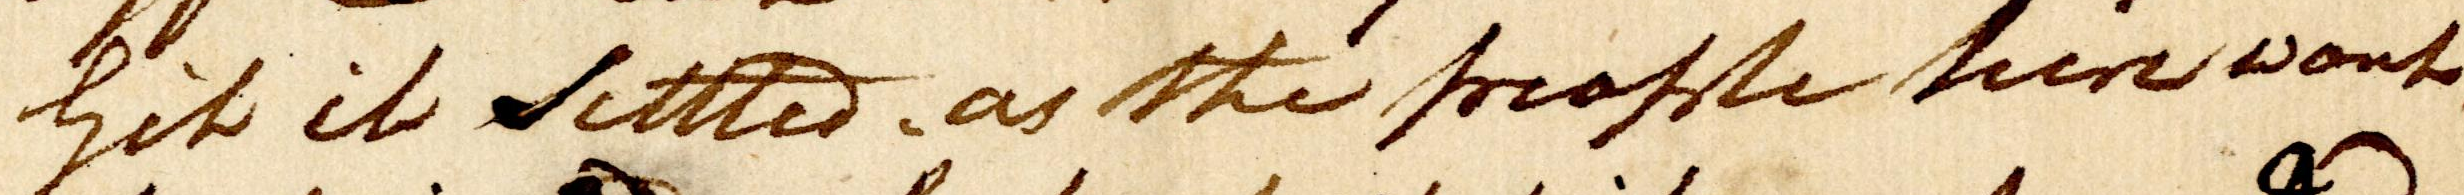Git it settled as the people here want
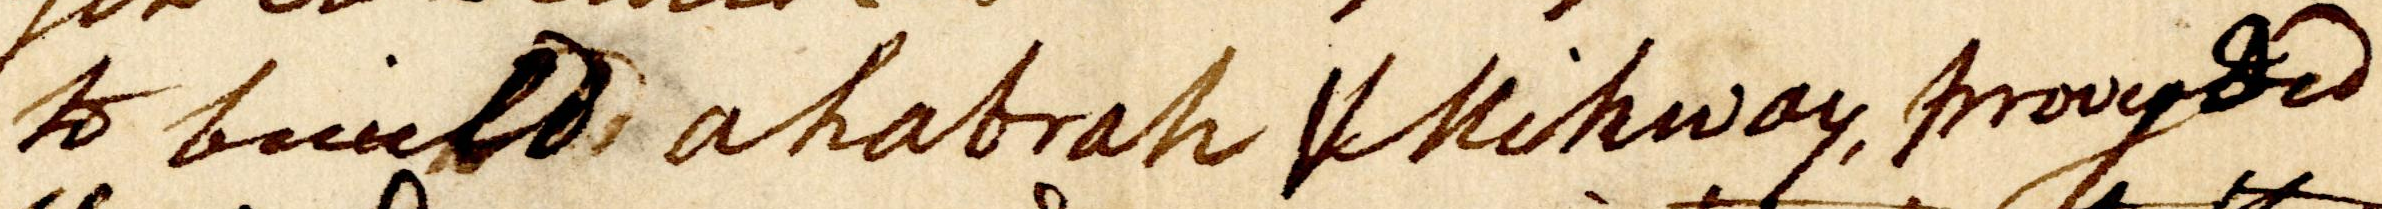to build a habrah & Mikway, provyded
